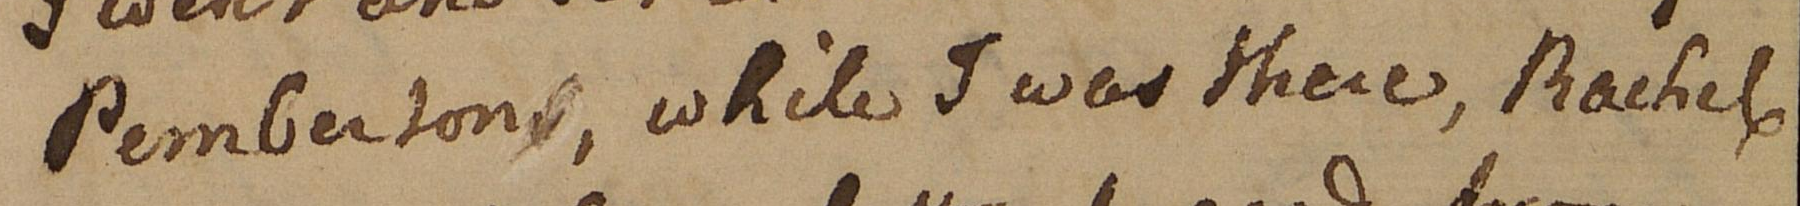Pembertons, while I was there, Rachel
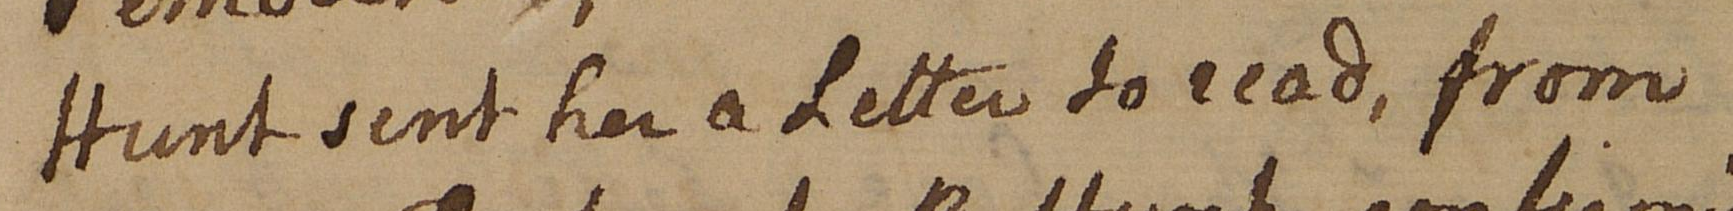Hunt sent her a Letter to read, from
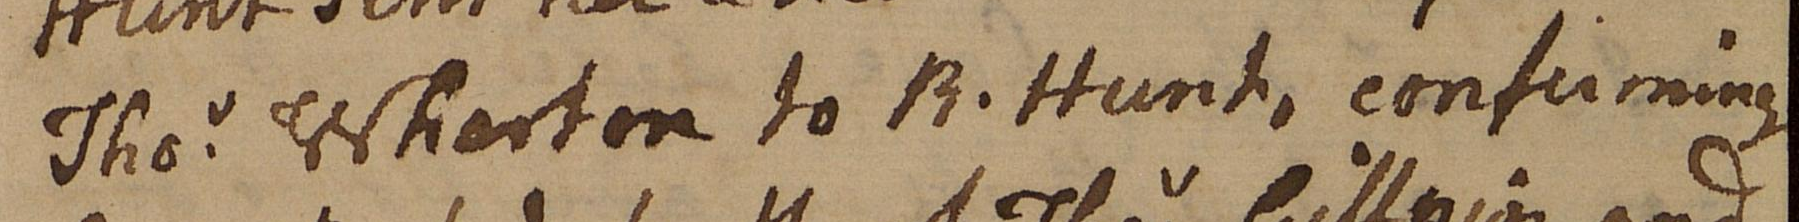Tho^s. Wharton to R. Hunt, confirming
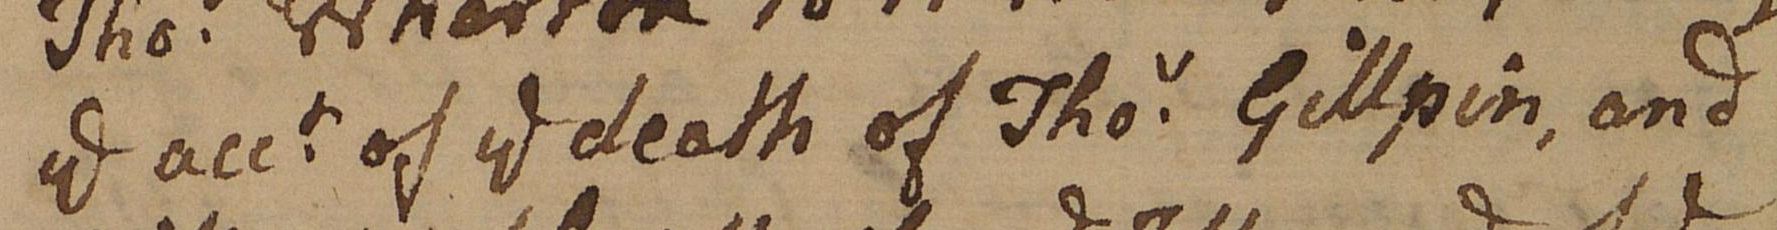y^e acc^t. of y^e death of Tho^s. Gillpin, and
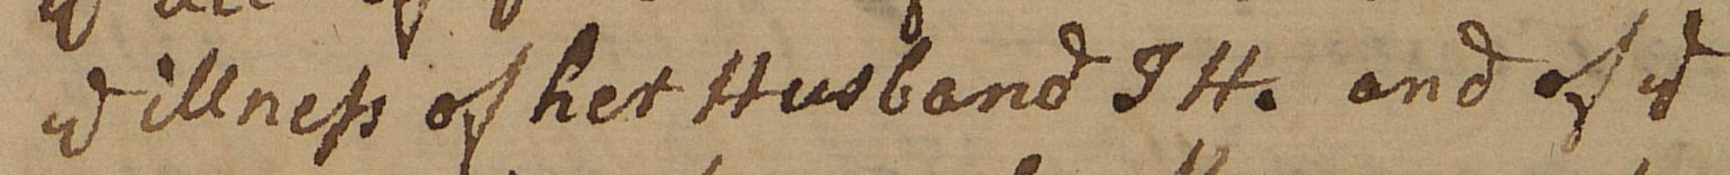y^e illness of her Husband JH. and of y^e
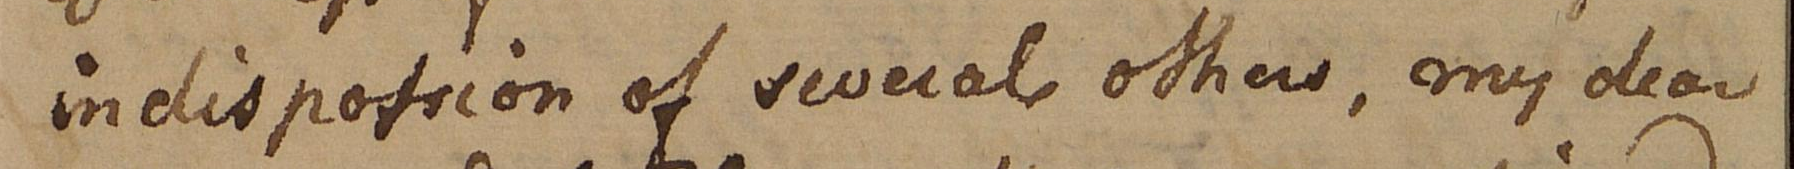indispossion of several others, my dear
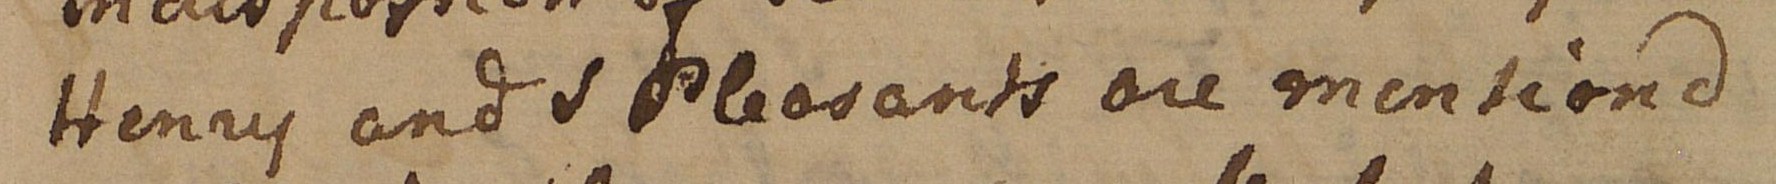Henry and S Pleasants are mentiond
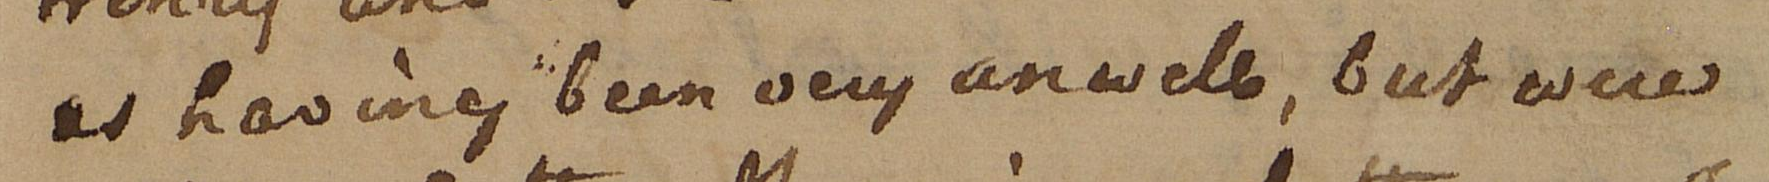as having been very unwell, but was
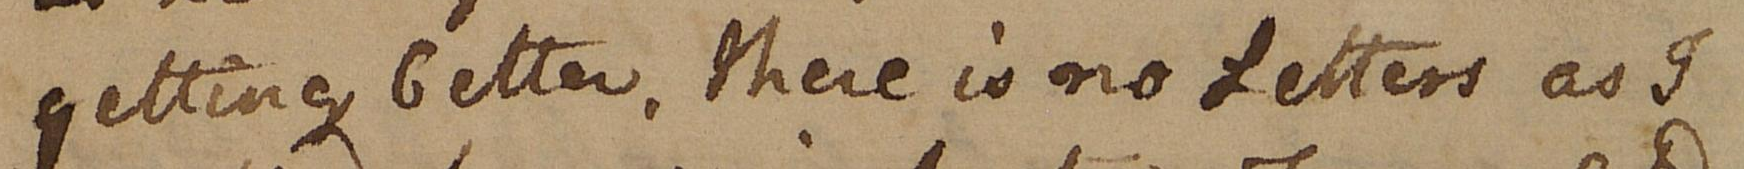getting better, there is no Letters as I
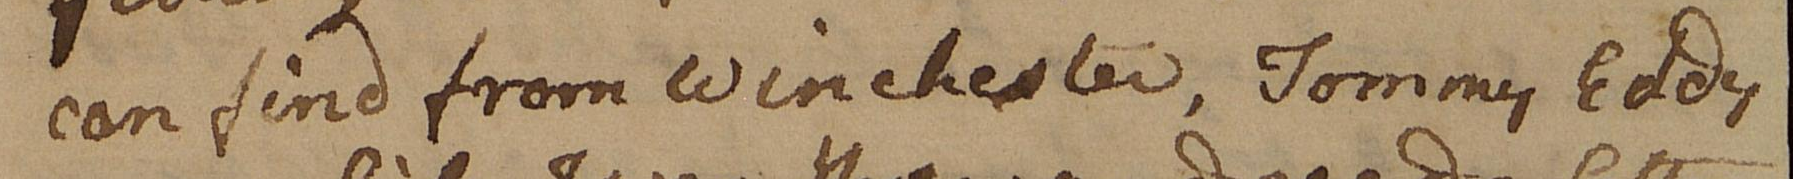can find from Winchester, Tommy Eddy
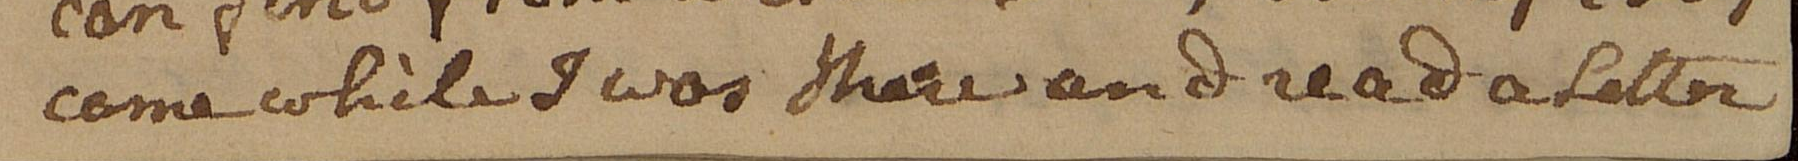come while I was there and read a Letter
